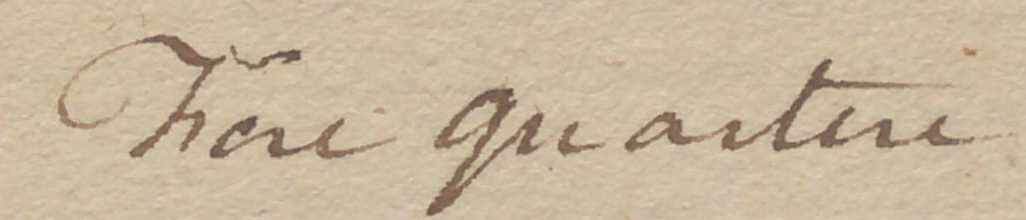Fore quarters
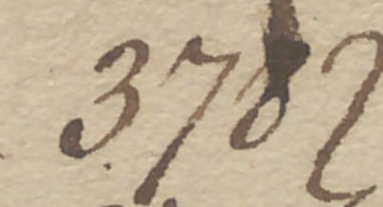378
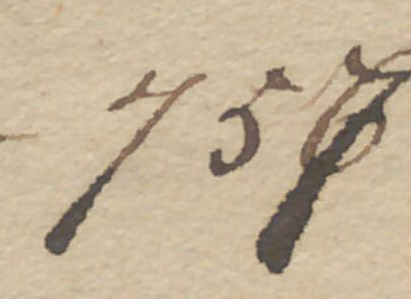757
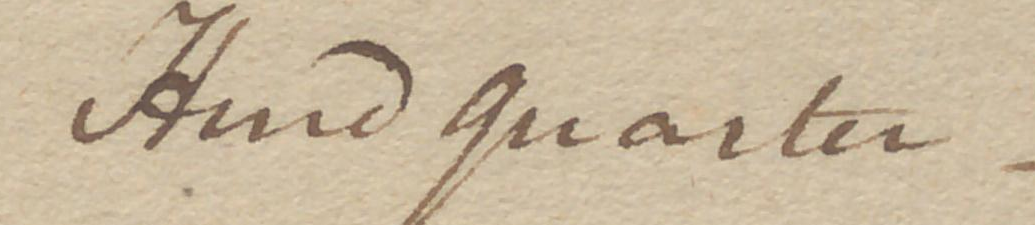Hind quarter
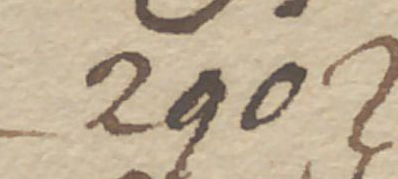290
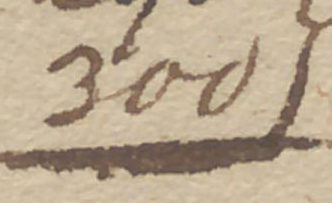300
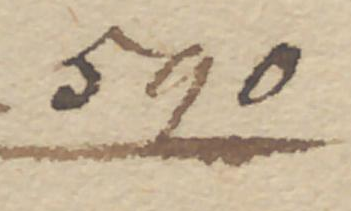590
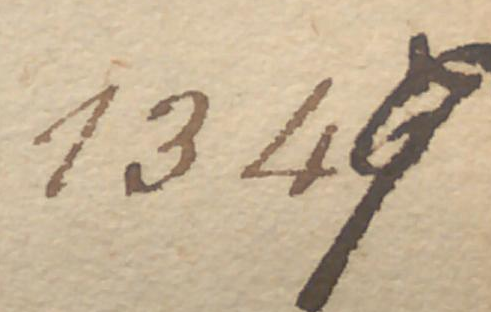1347
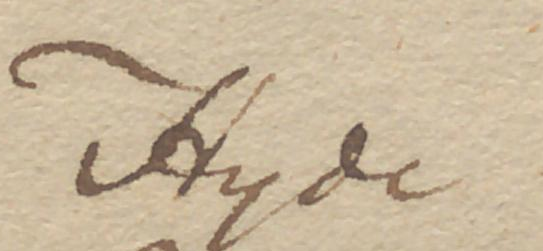Hyde
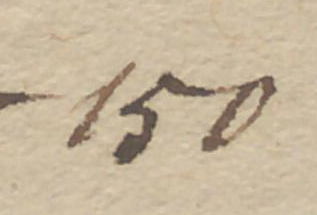150
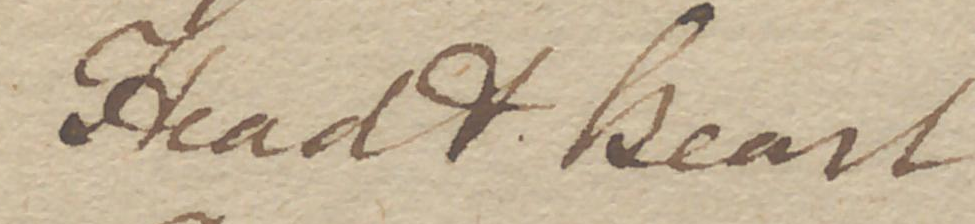Head & heart
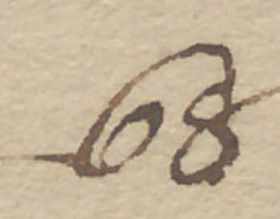68
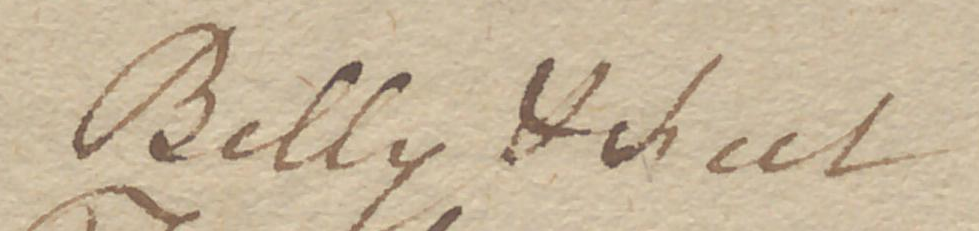Belly & Feet
